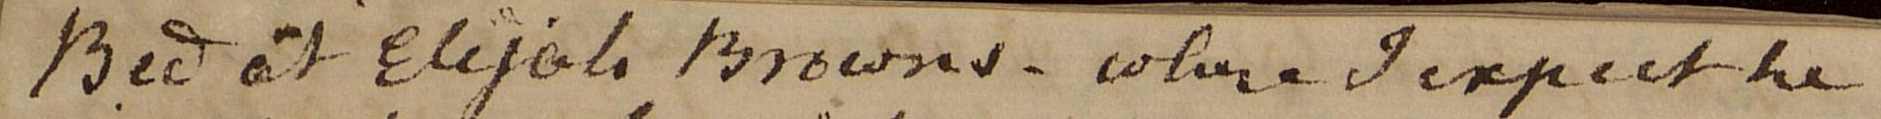Bed at Elijah Browns- where I expect he
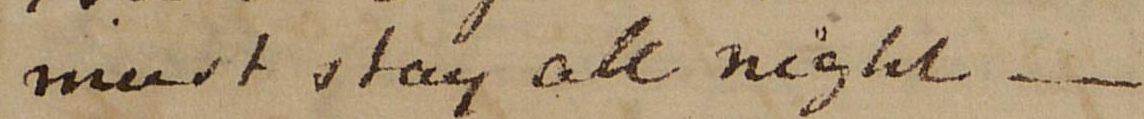must stay all night-
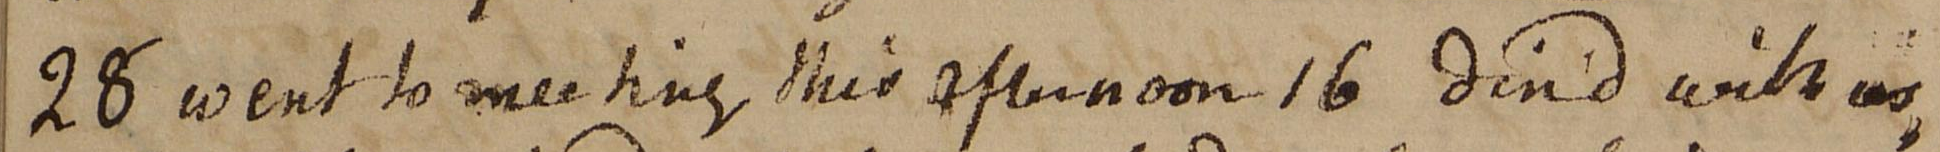28 went to meeting this afternoon 16 din'd with us,
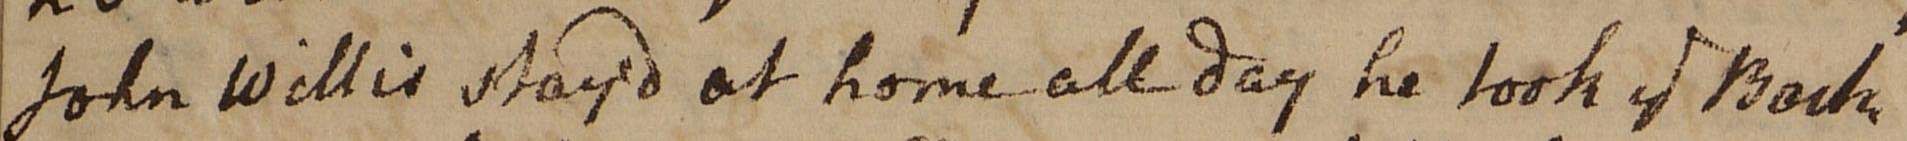John Willis stay'd at home all day he took y^e Bark
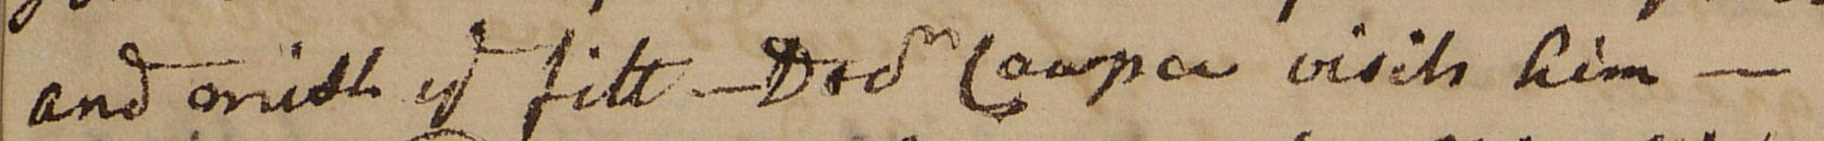and mist y^e fitt- Doc^r. Cawper visits him-
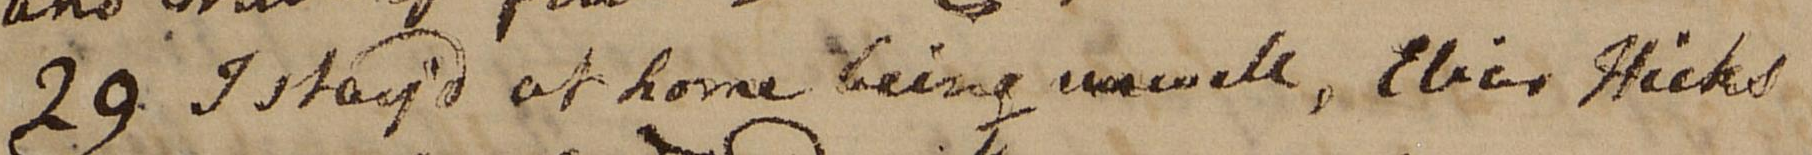29 I stay'd at home being unwell, Elias Hicks
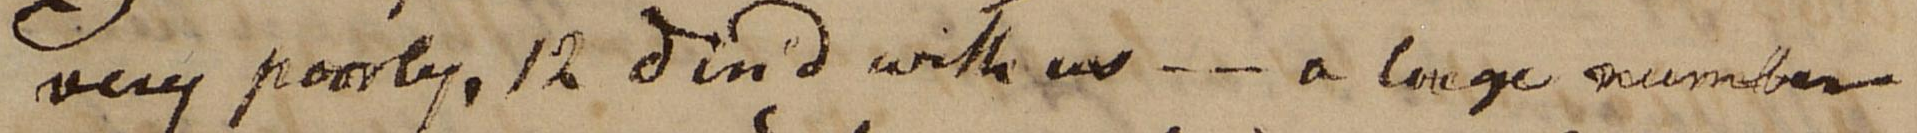very poorly, 12 din'd with us-- a large number
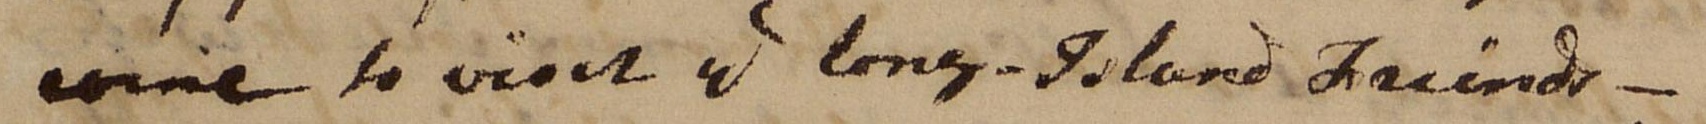come to visit y^e long-Island Friends-
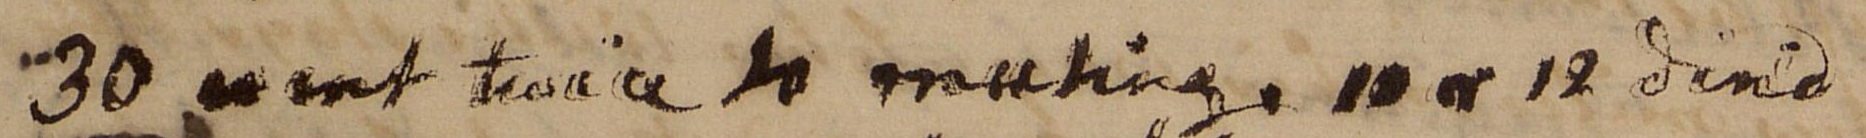30 went [twice] to meeting, 10 or 12 din'd
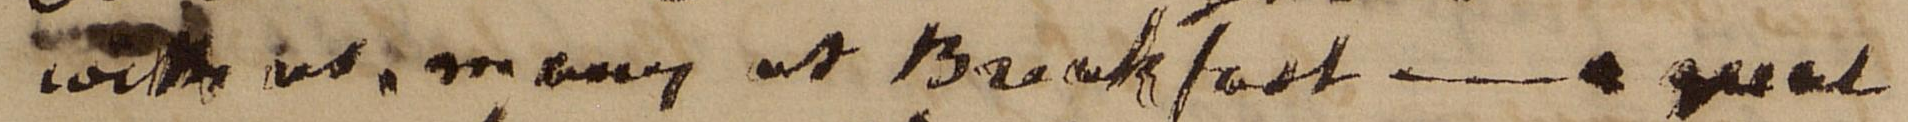with us, many at Breakfast- a equal
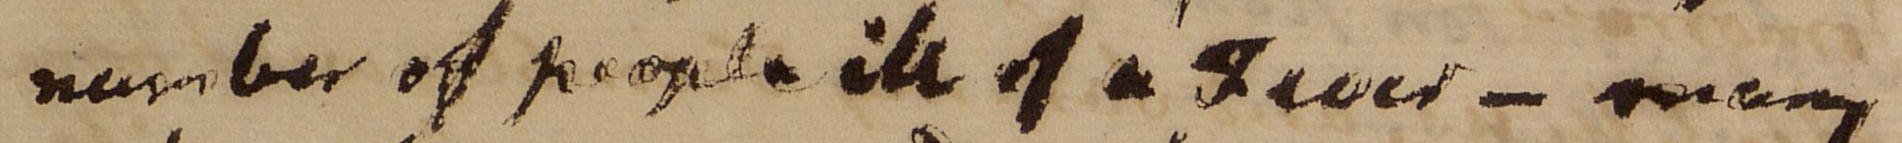number of people ill of a Fever- many
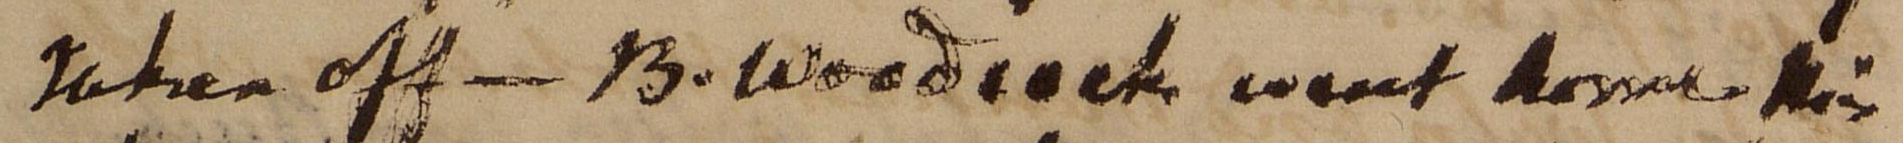taken off- B. Woodsock went home this
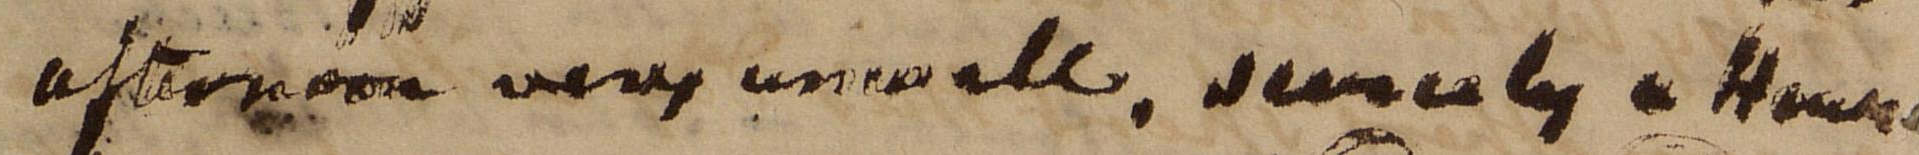afternoon very unwell, scarcely a Hour
